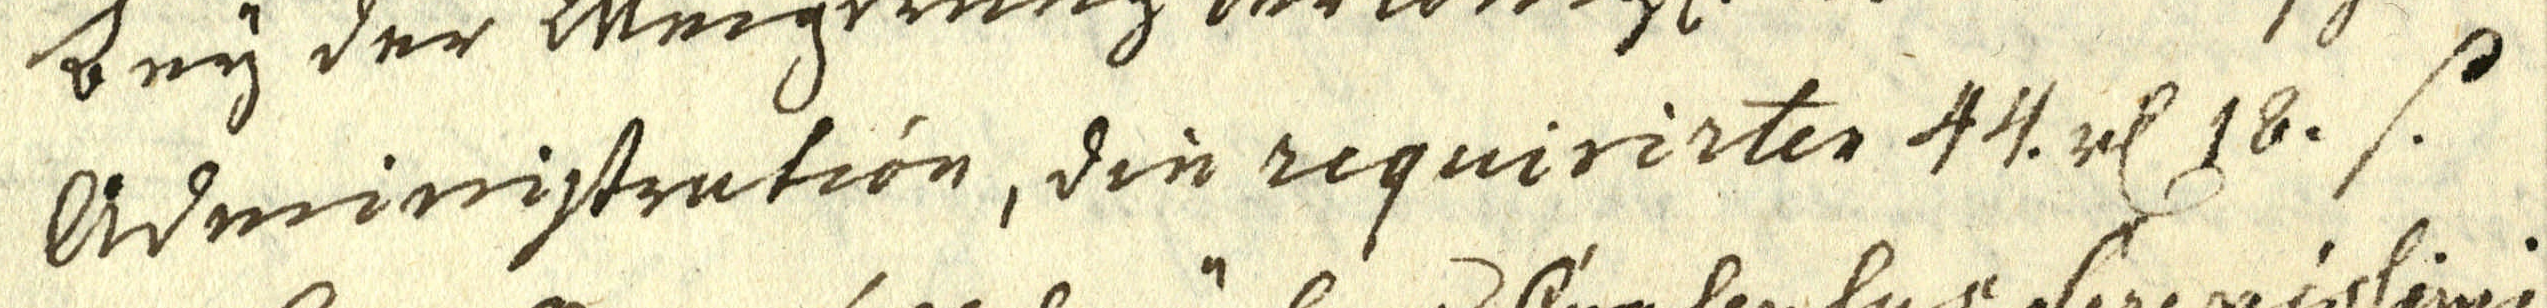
Administration, die requirirten 44. r.18. s.
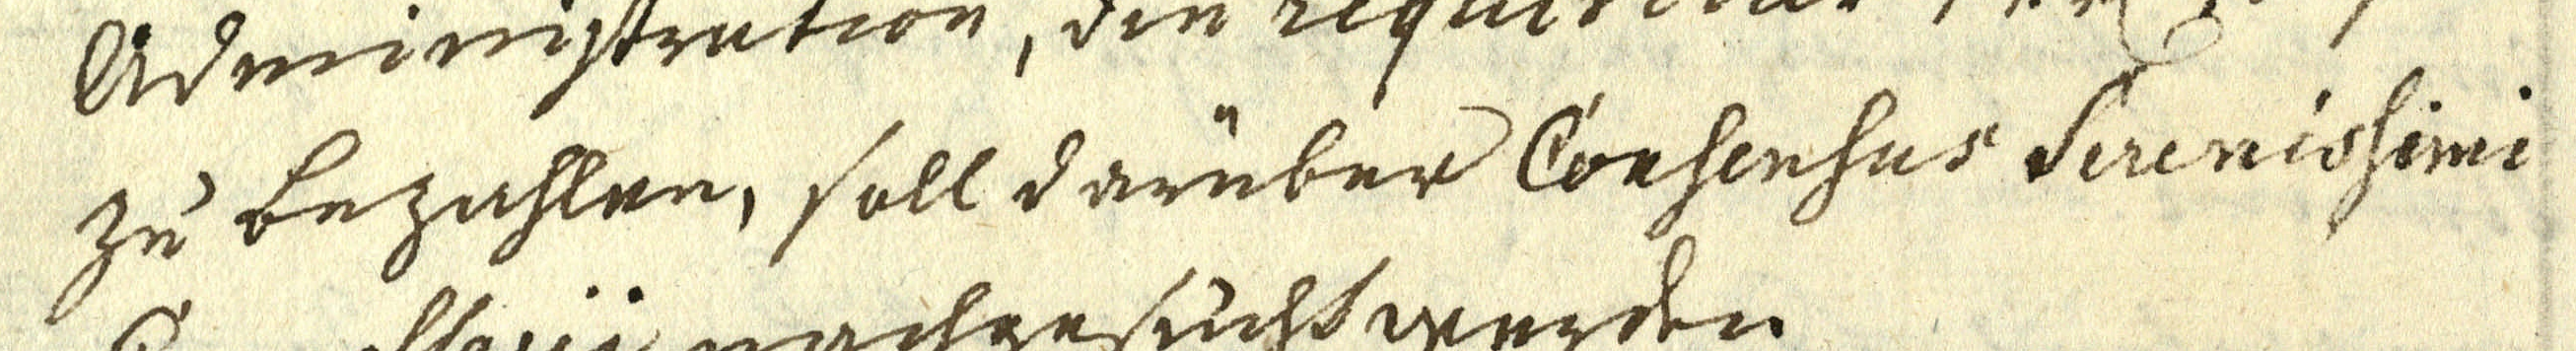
zu bezahlen, soll darüber Consensus Serenissimi
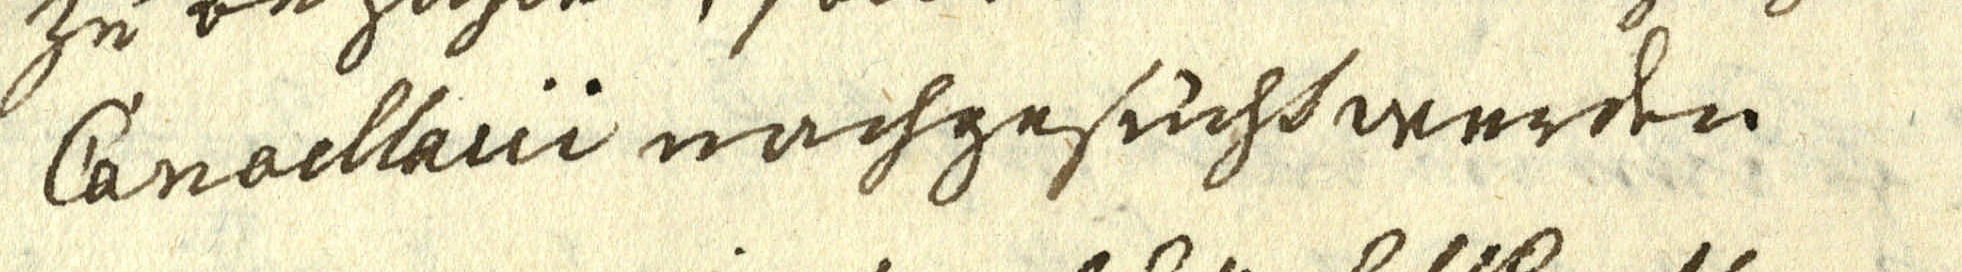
Cancellarii nachgesucht werden.
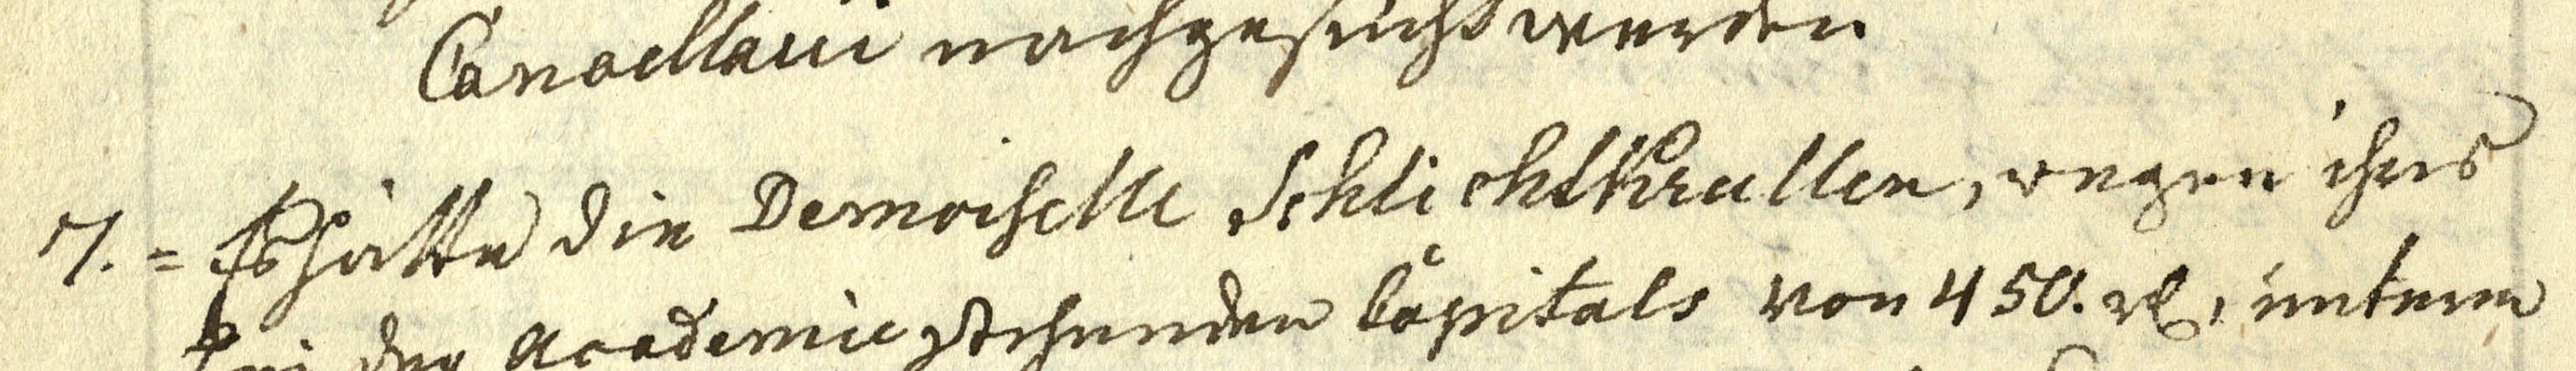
7. Es hätte die Demoiselle Schlichtkrullen, wegen ihres
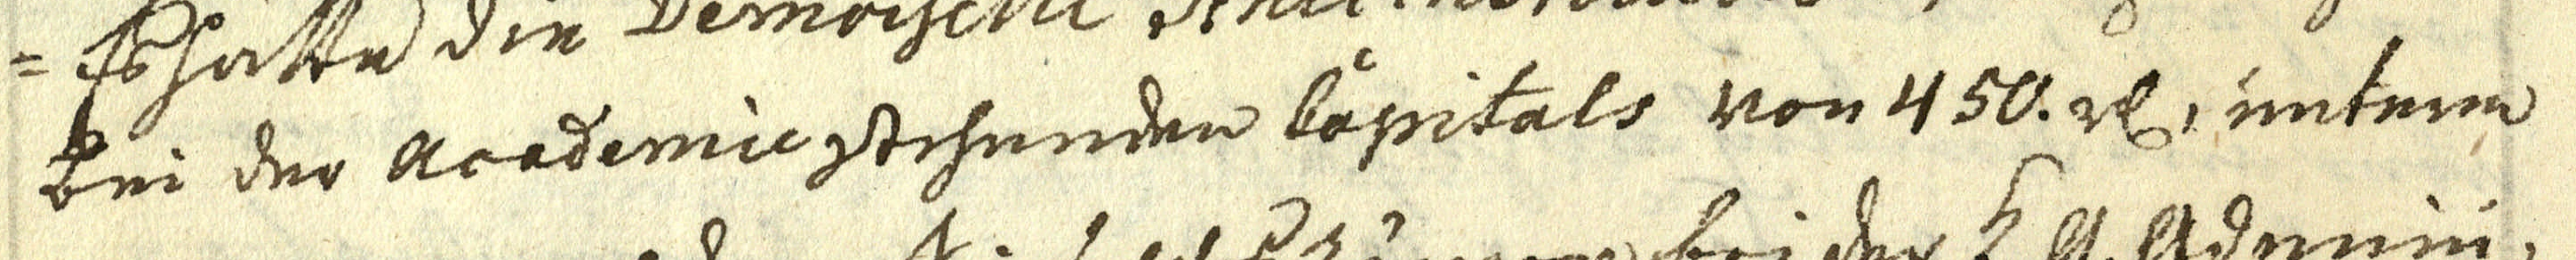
bei der Academie stehenden Capitals von 450. r, unterm
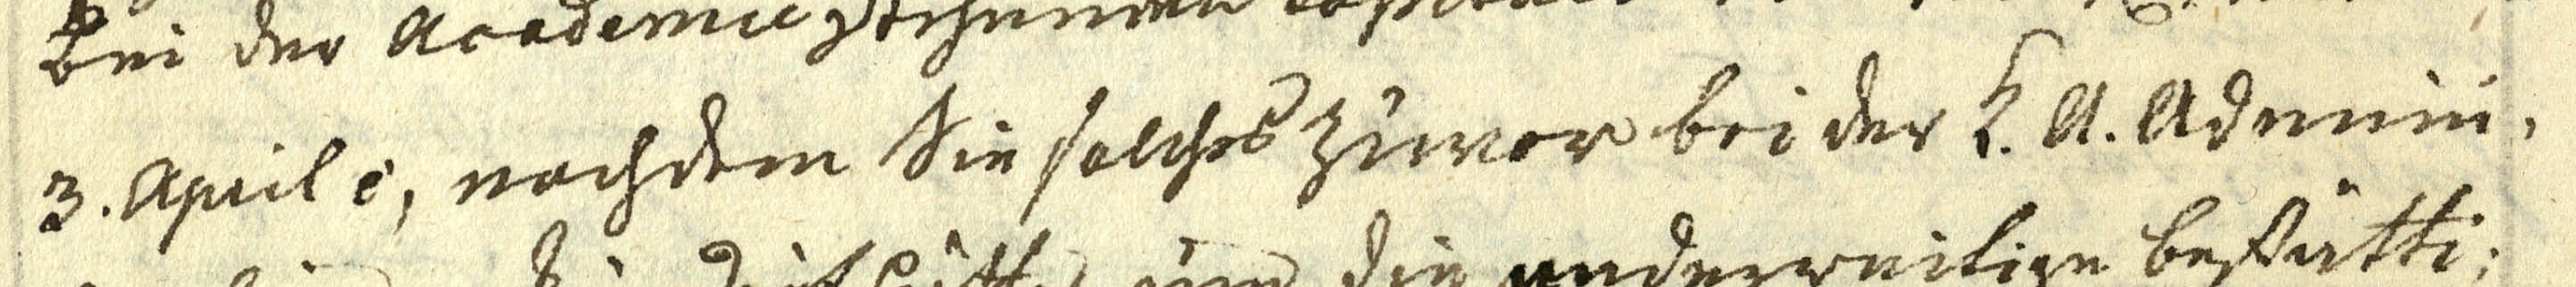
3. April c, nachdem Sie solches zuvor bei der K. M. Admini¬
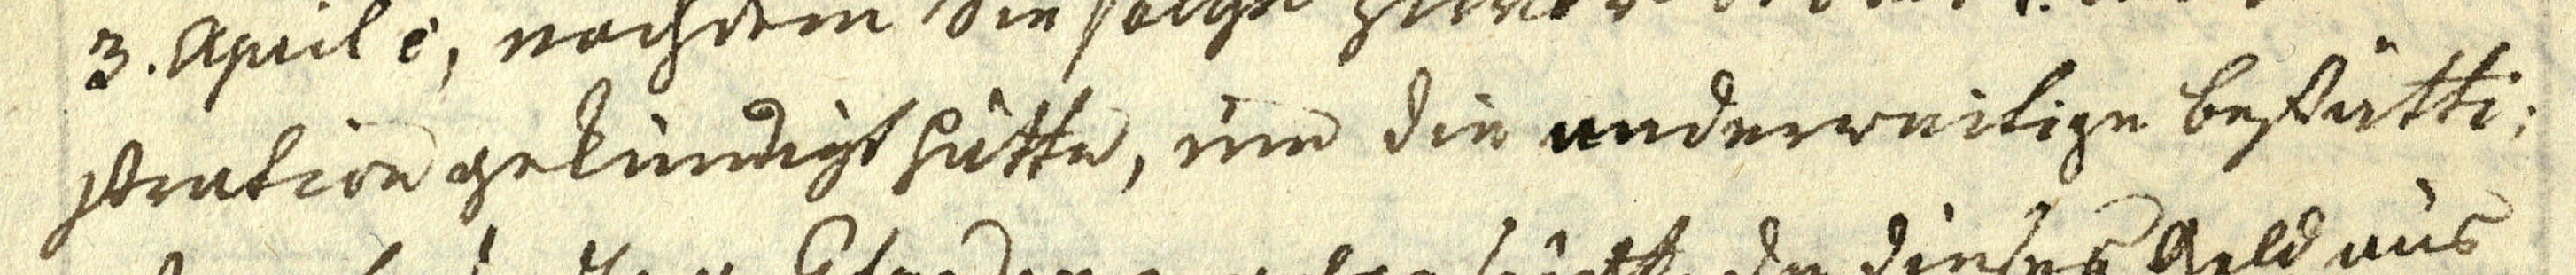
stration gekündigt hätte, und die anderweitige Bestätti¬
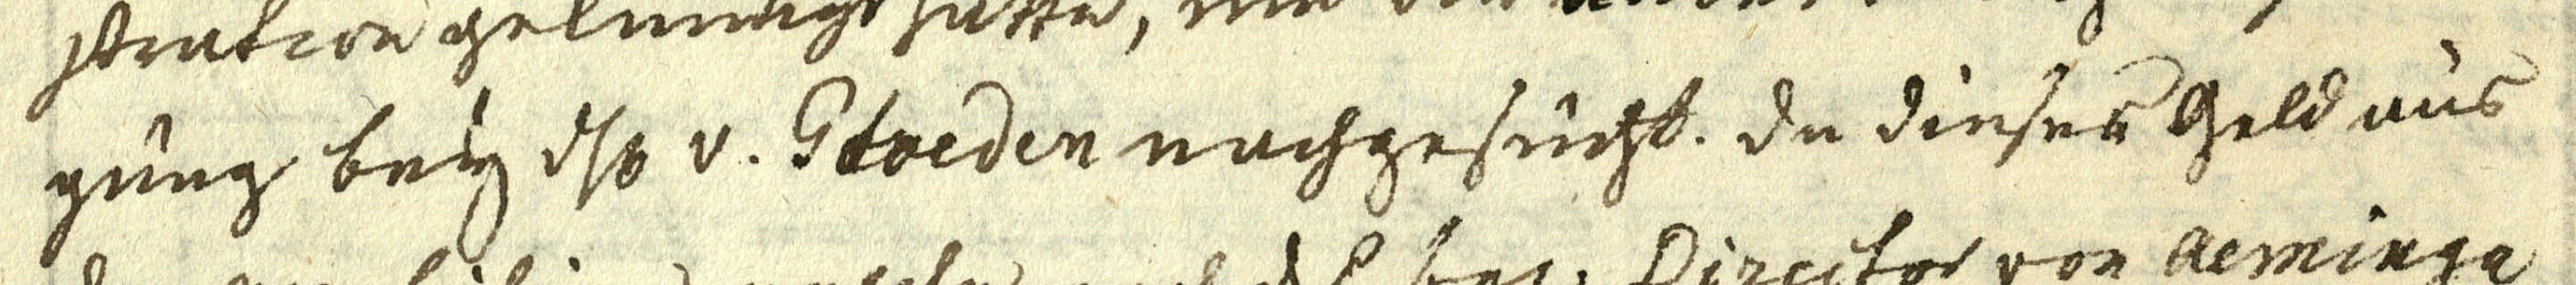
gung beÿ dh v. Gloeden nachgesucht. Da dieses Geld aus
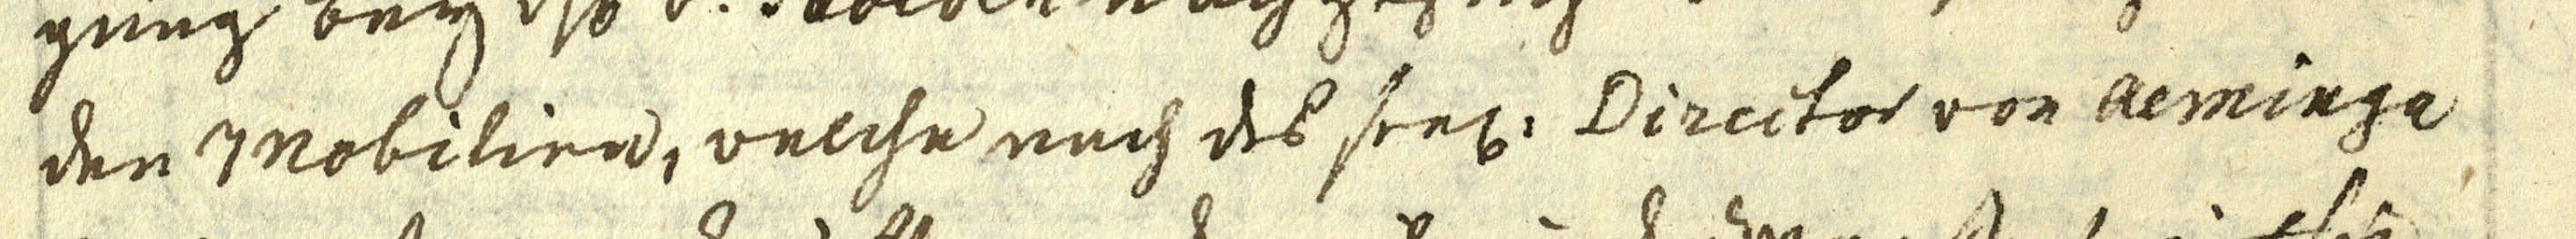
den Mobilien, welche nach des seel. Director von Aeminga
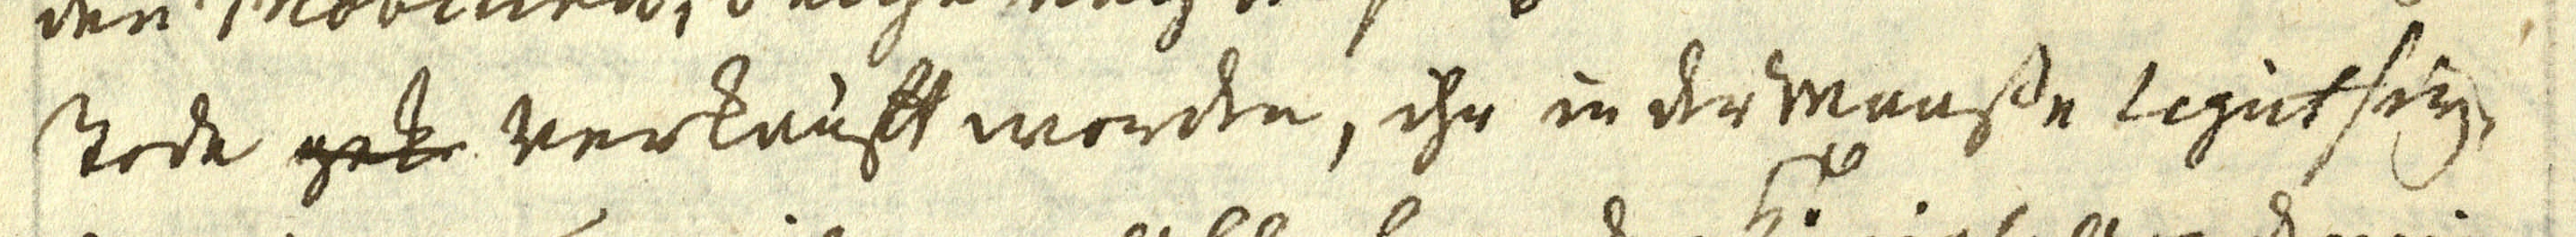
Tode gek verkauft worden, ihr in der Maaße legirt seÿ,
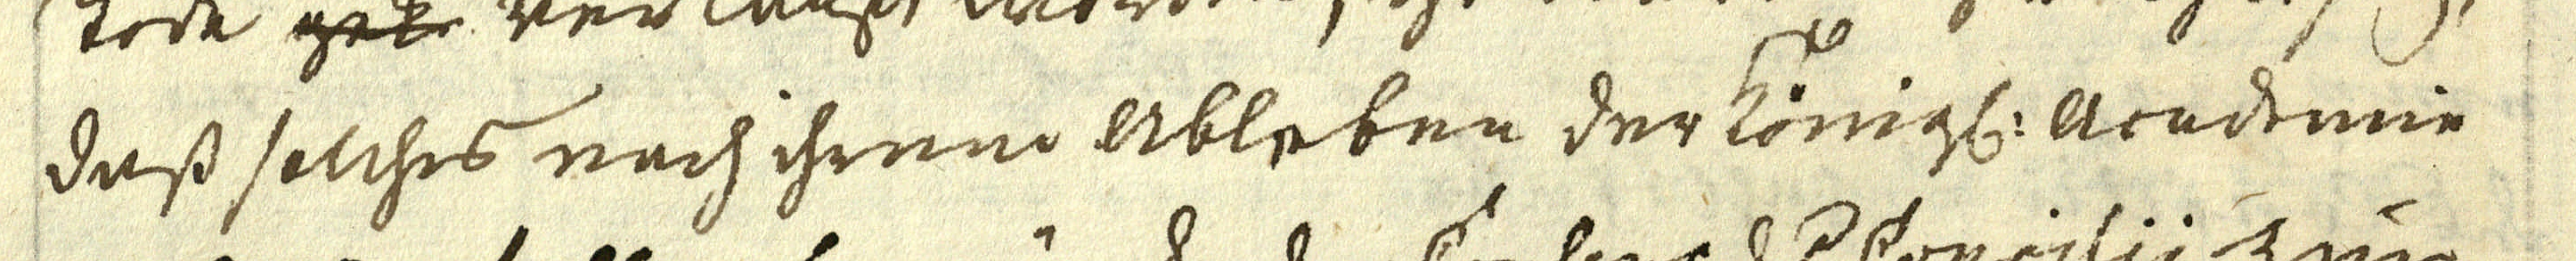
daß solches nach ihrem Ableben der Königl. Academie
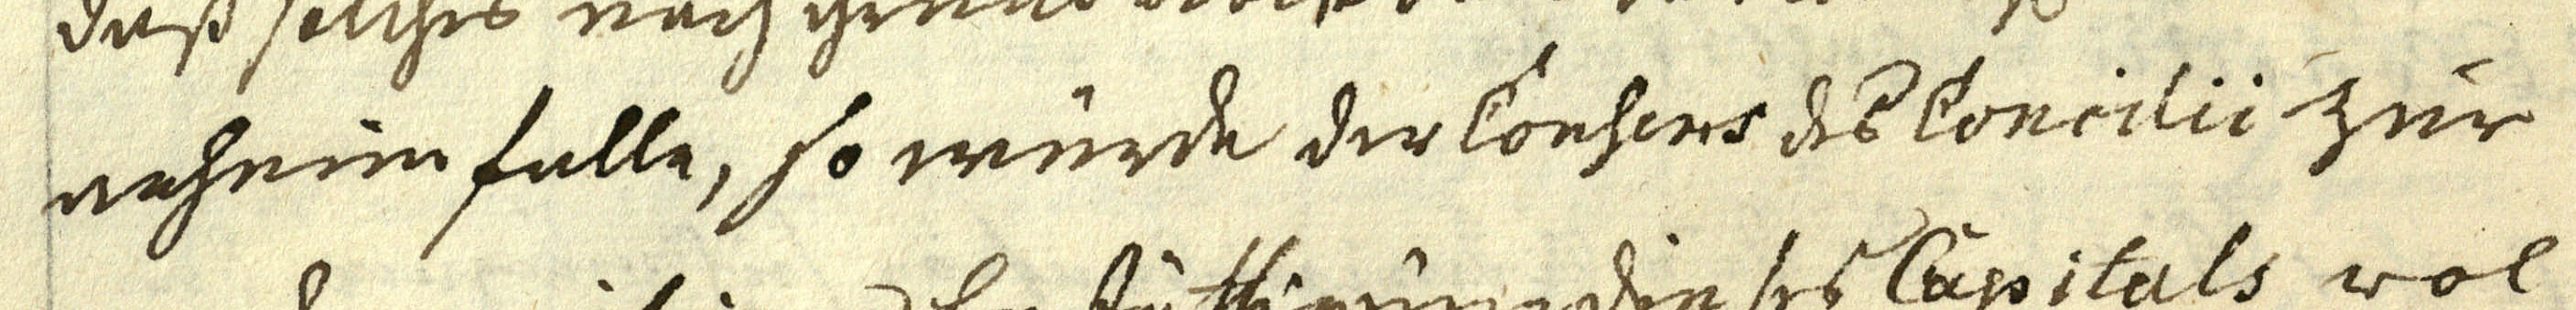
anheim falle, so würde der Consens des Concilii zur
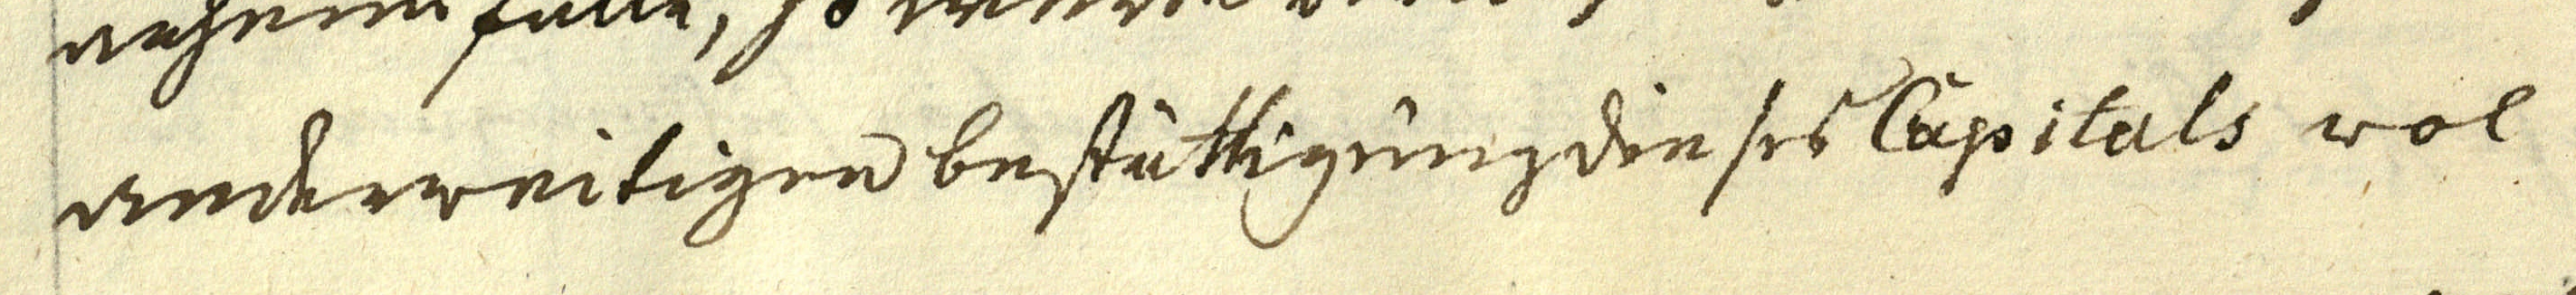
anderweitigen Bestättigung dieses Capitals wol
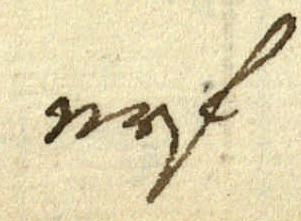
erf
